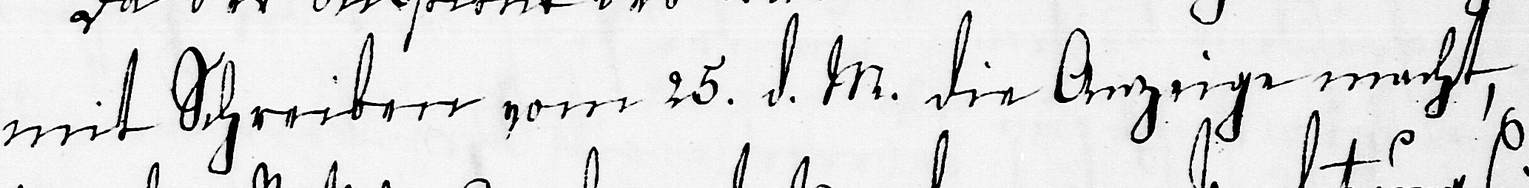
mit Schreiben vom 25. d. M. die Anzeige macht,
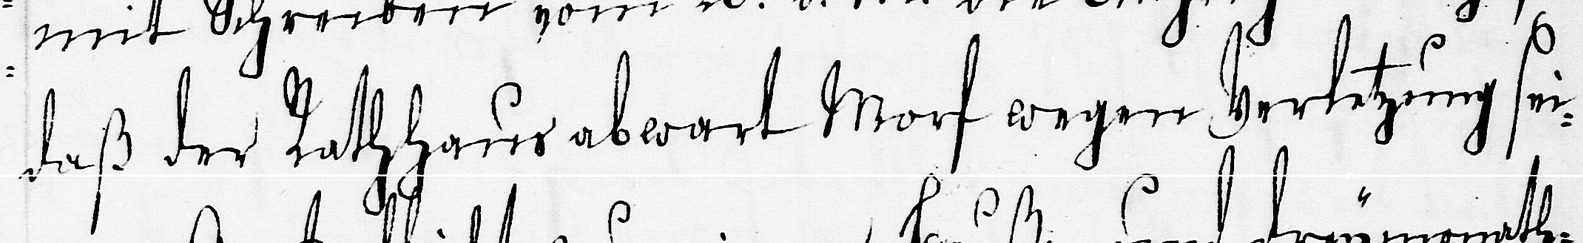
daß der Rathhausabwart Morf wegen Verletzung sei¬
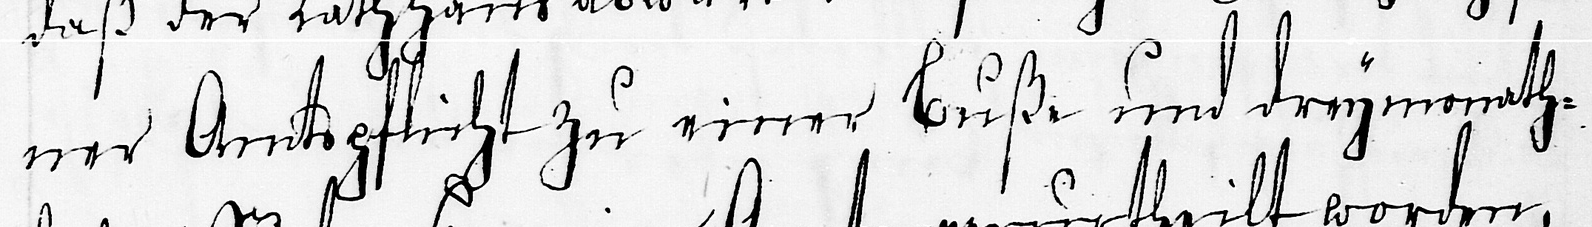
ner Amtspflicht zu einer Buße und dreymonath¬
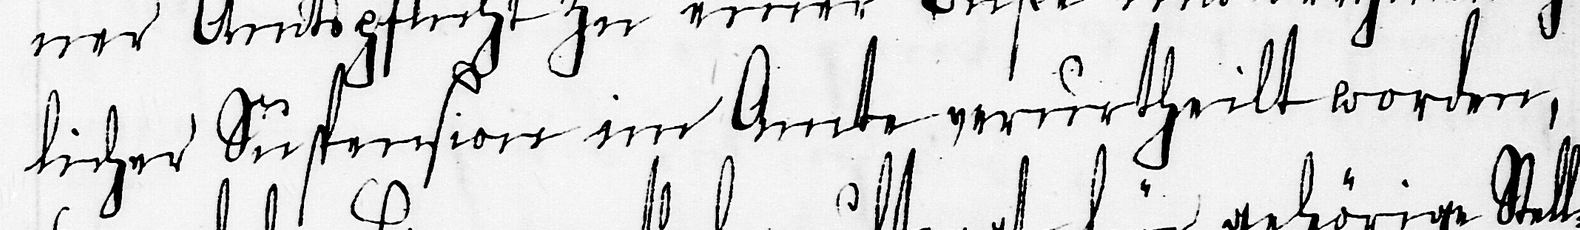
licher Suspension im Amte verurtheilt worden,
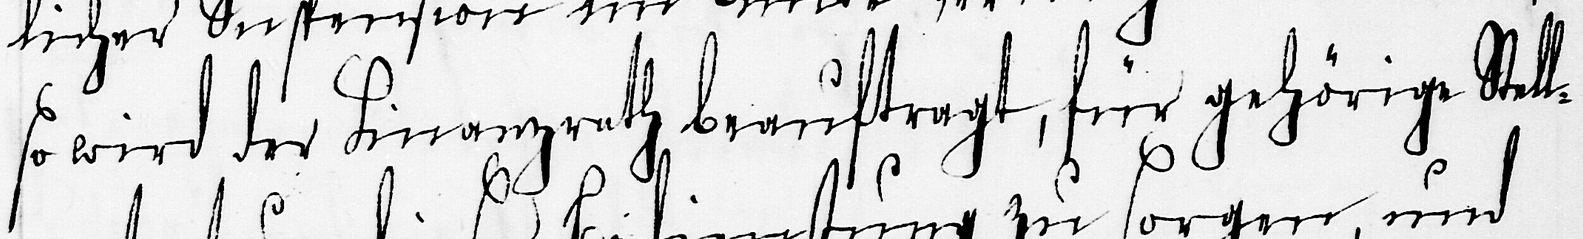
so wird der Finanzrath beauftragt, für gehörige Stel¬
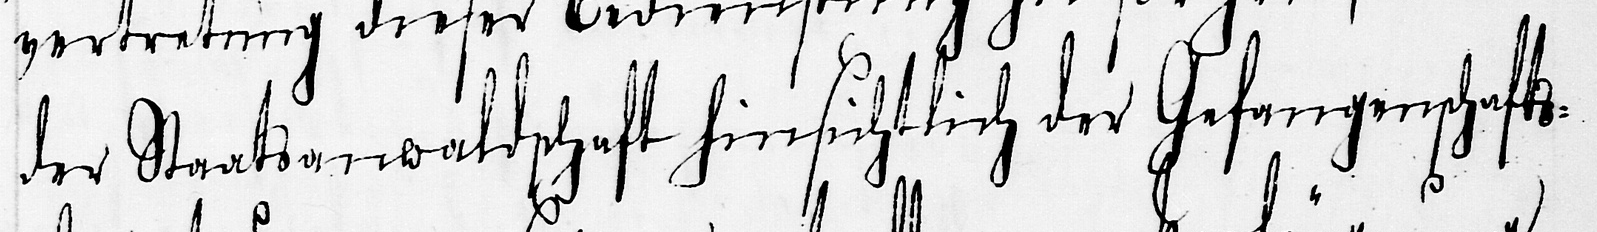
der Staatsanwaldschaft hinsichtlich der Gefangenschafts¬
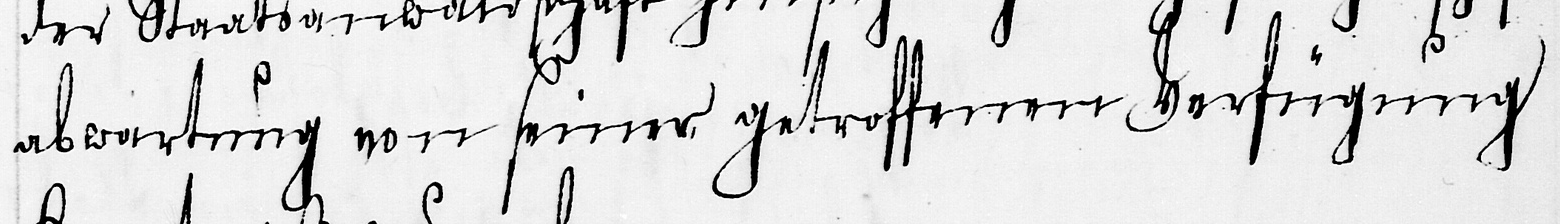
abwartung von seiner getroffenen Verfügung
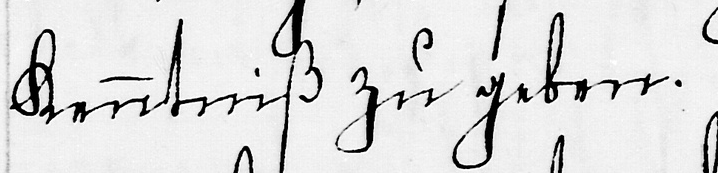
Kenntniß zu geben.
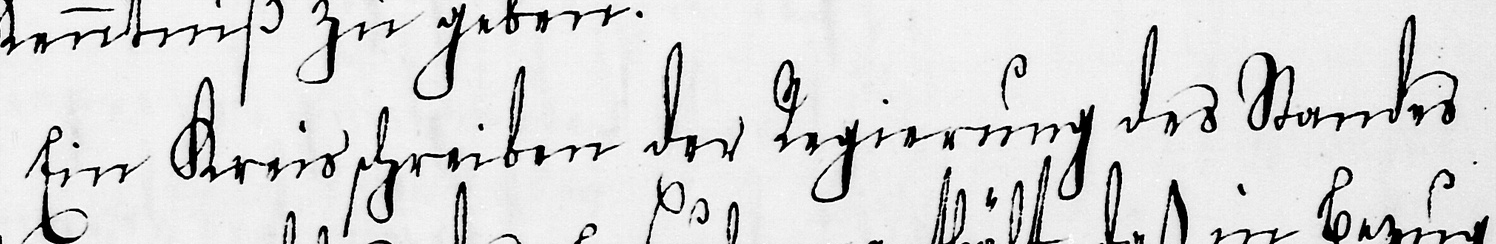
Ein Kreisschreiben der Regierung des Standes
